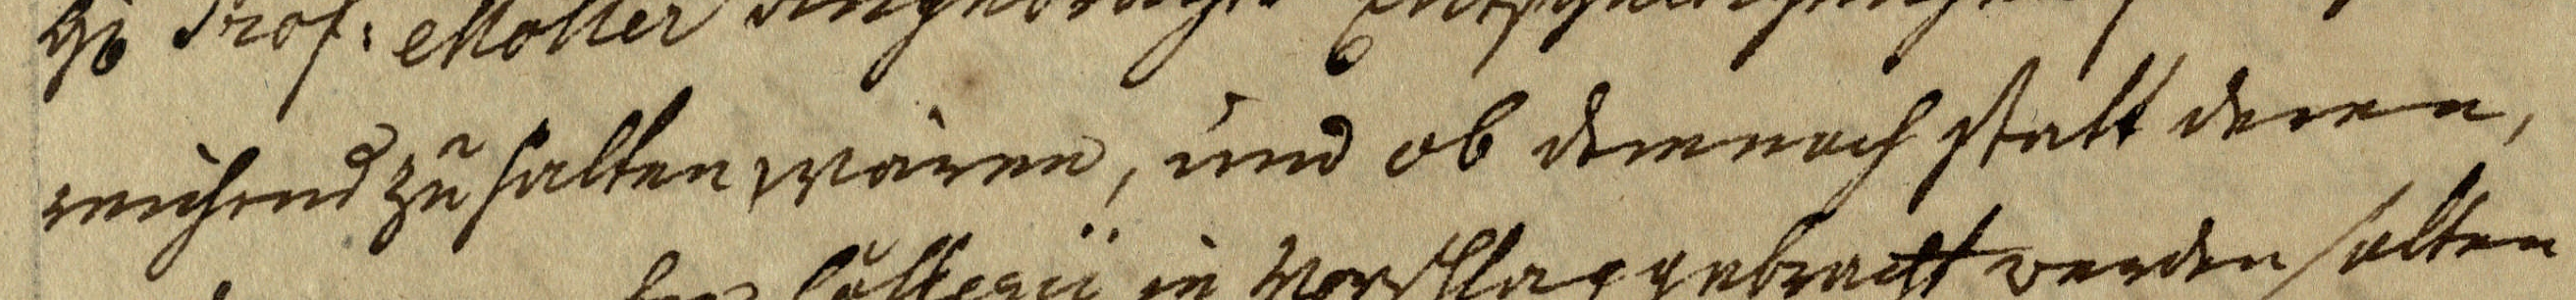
reichend zu halten wären, und ob demnach statt deren,
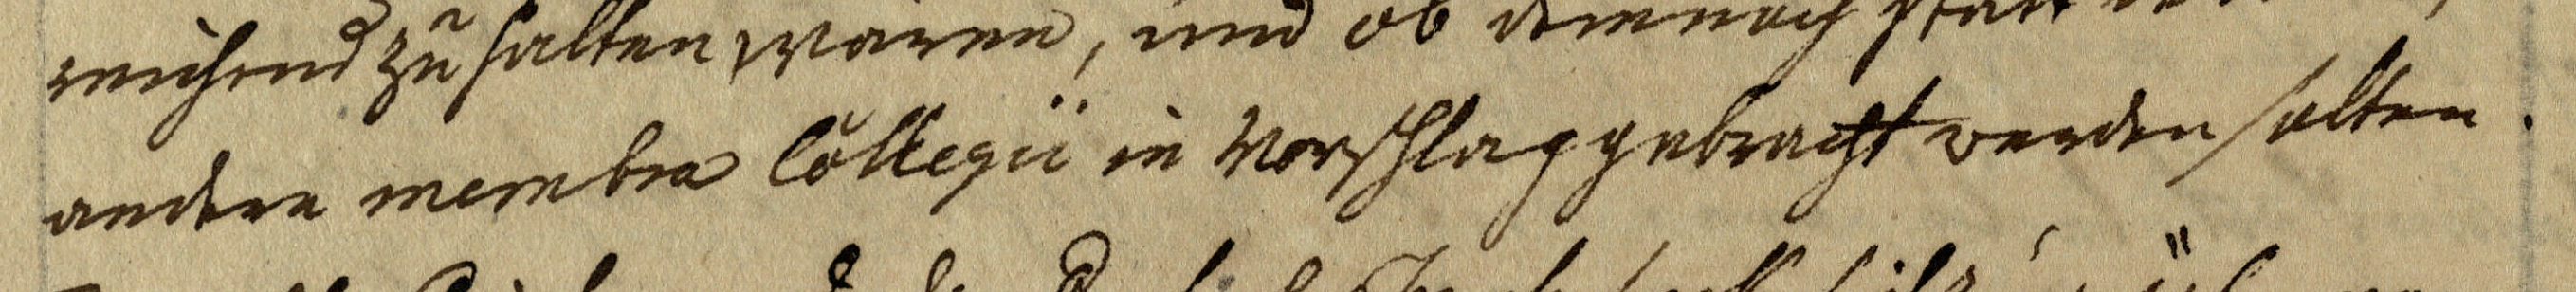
andere membra Collegii in Vorschlag gebracht werden sollten.
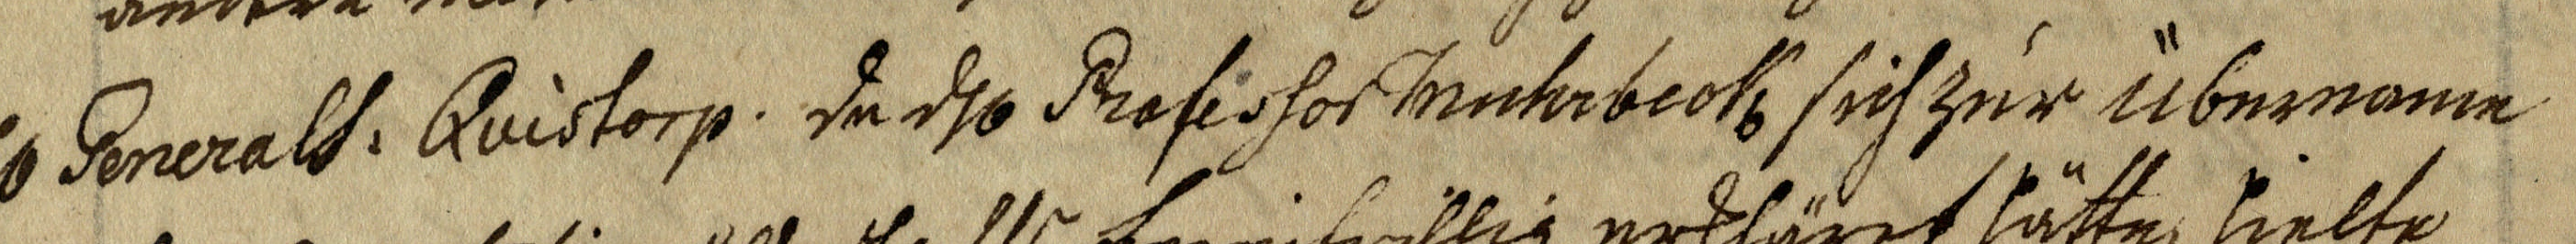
dh GeneralS. Quistorp. Da dh Professor Muhrbeck sich zur Übername
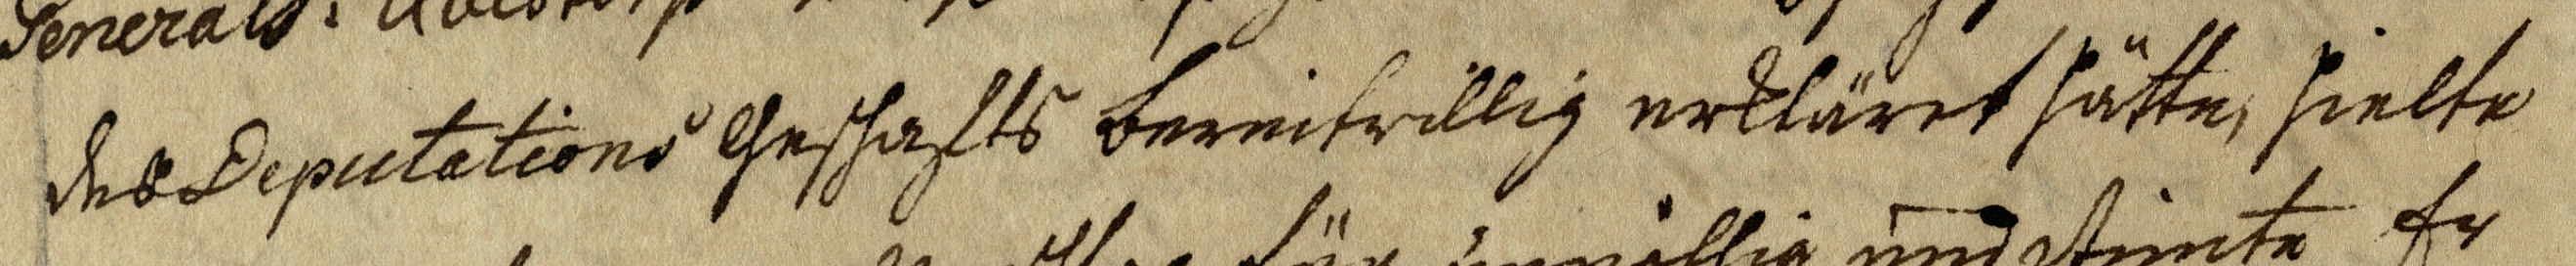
des Deputations Geschäfts bereitwillig erkläret hätte, hielte
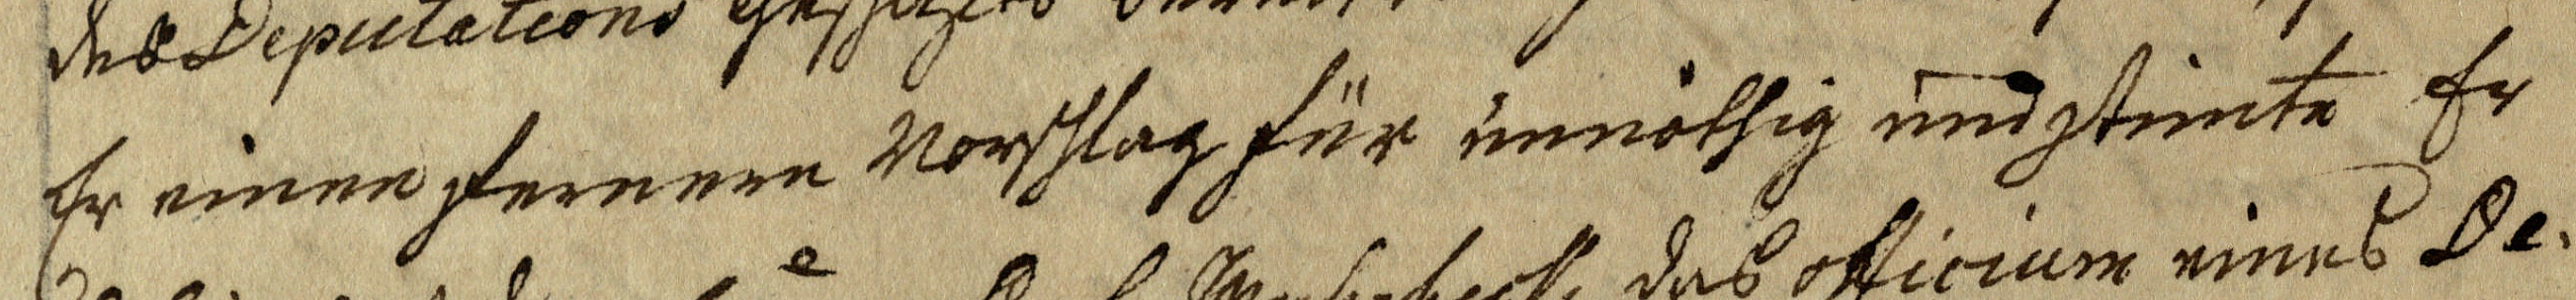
Er einen ferneren Vorschlag für unnöthig und stimte Er
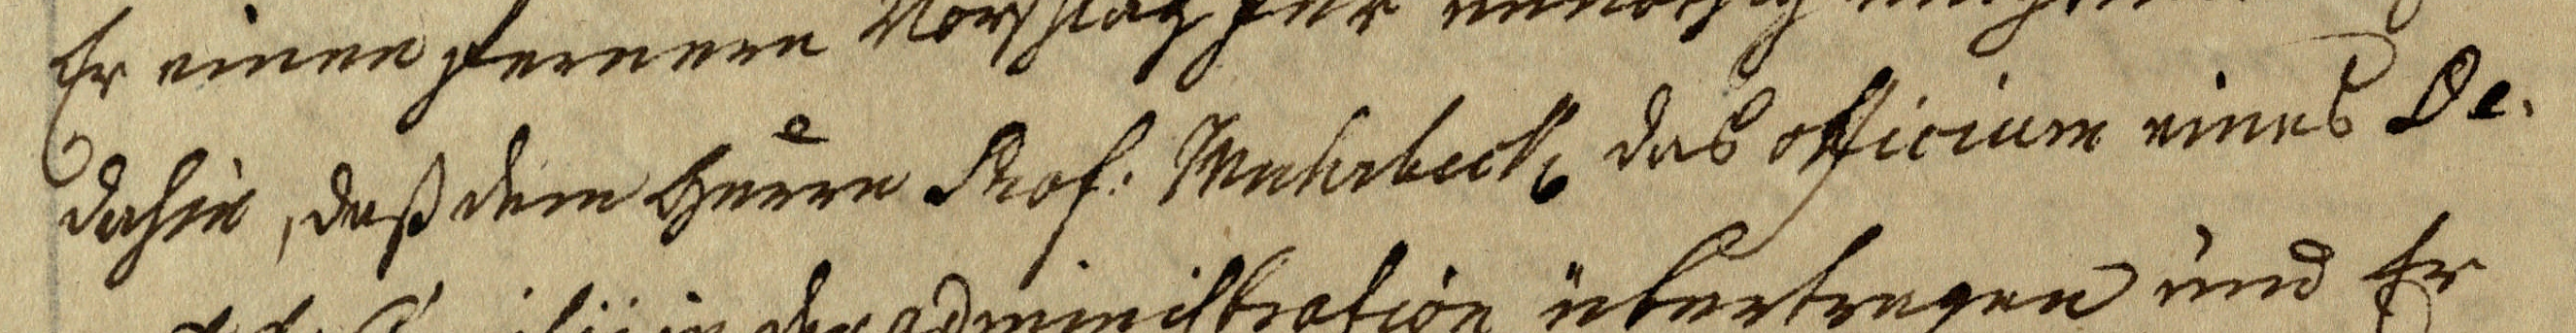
dahin, daß dem Herrn Prof. Muhrbeck. das officium eines De¬
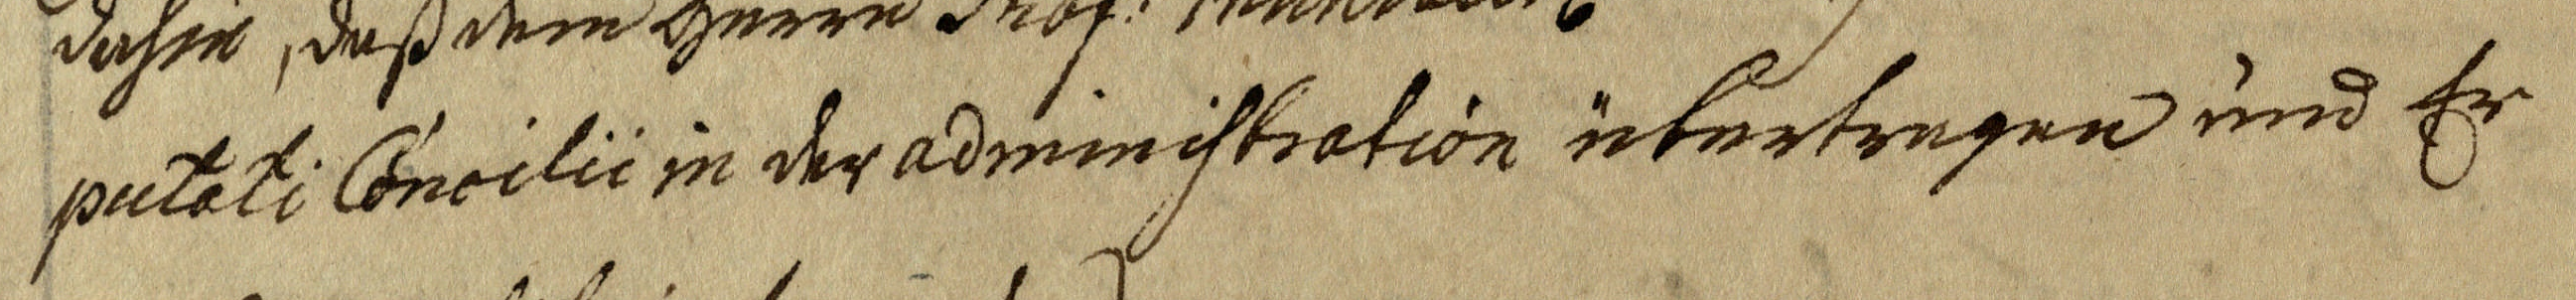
putati Concilii in der Administration übertragen und Er
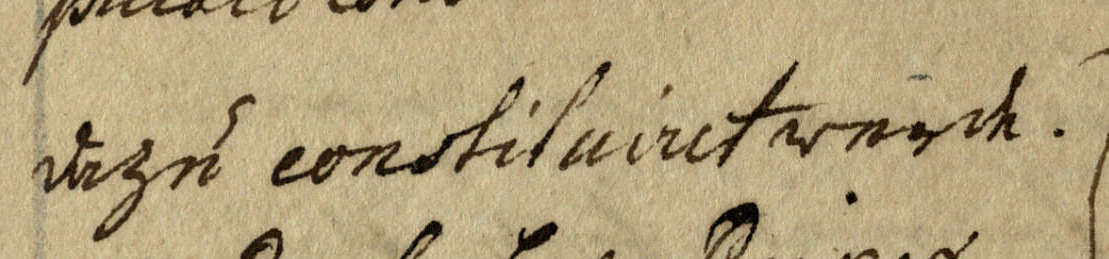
dazu constituiret werde.
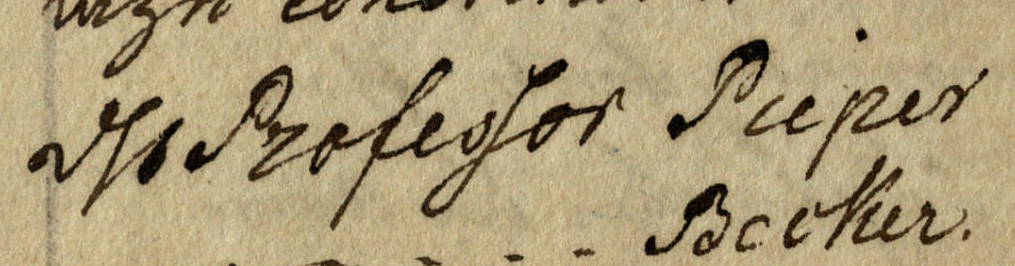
dh Professor Pieper
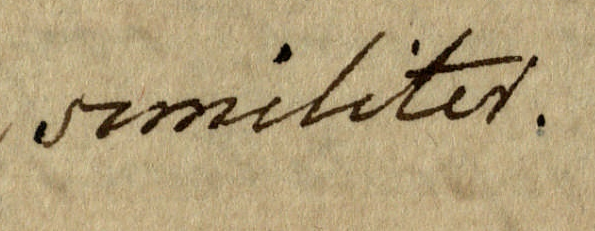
similiter
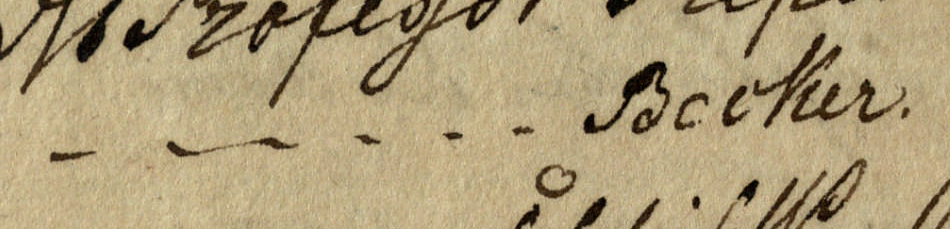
Becker.
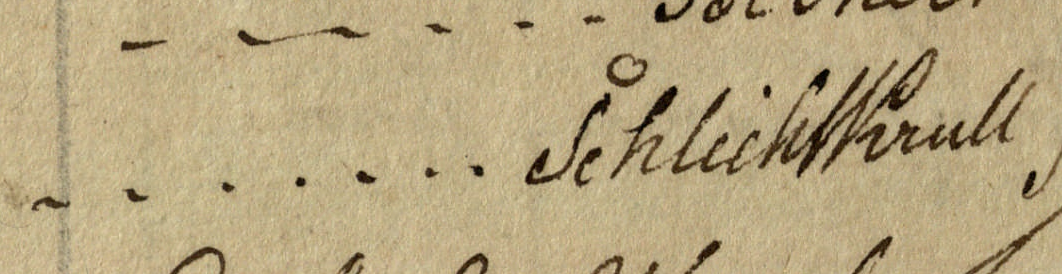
Shlictkrull
